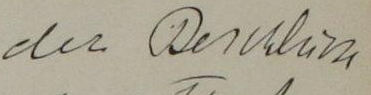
der Beschlüsse
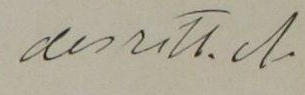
des ritt. A.
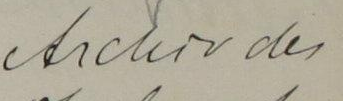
Archiv des
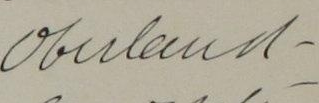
Oberland
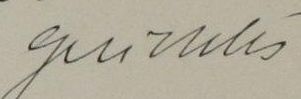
gerichtes
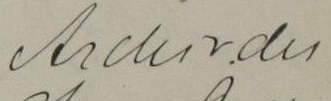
Archiv der
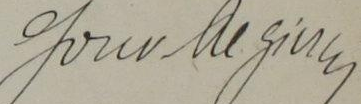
Gouv. Regierung
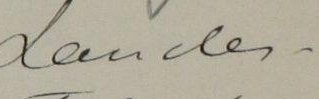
Landes
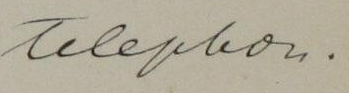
telephon
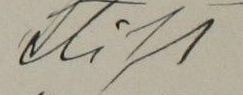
Stift
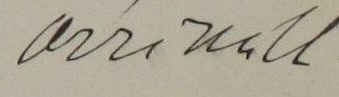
Orriküll
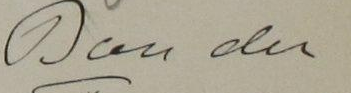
Bau der
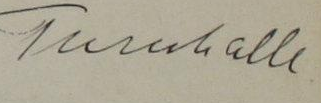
Turnhalle
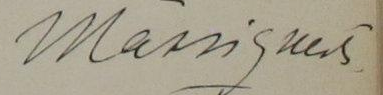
Mässigkeits
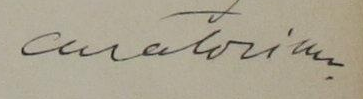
curatorium
